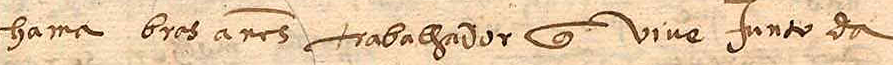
chama bras an̄es trabalhador q̄ viue Junto da
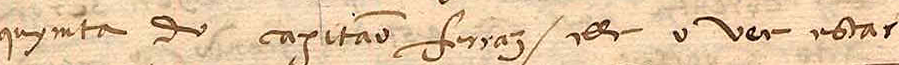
quymta do capitão ferraz / elle o vee estar
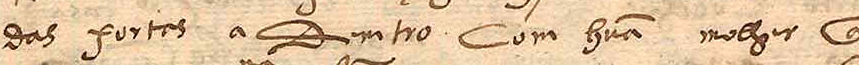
das portas aDemtro Com huā molher q̄
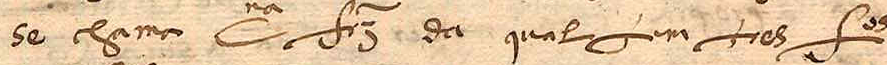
se chama Cna frz̄ da quaL tem tres fos
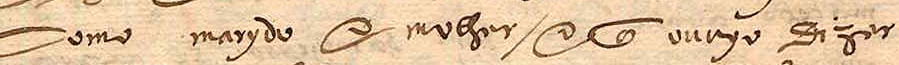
Como marydo e molher / e q̄ ouuyo dizer
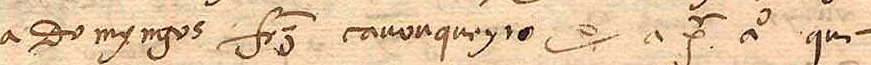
a domyngos frz̄ cauouqueyro e a pe ao que
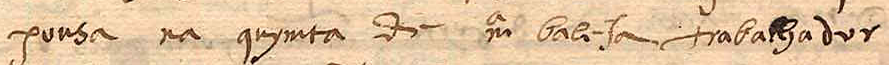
pousa na quymta de ma baleJa trabalhador
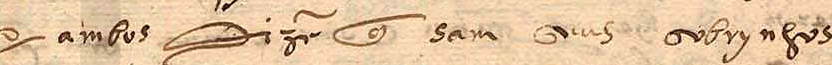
e ambos Dizē q̄ sam seus sobrynhos
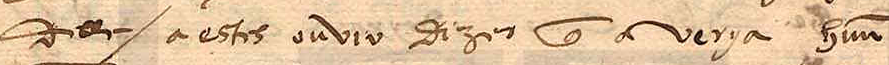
delle / a estes ouvio dizer q̄ averya hūu
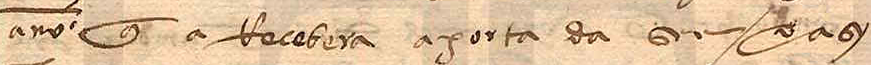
āno q̄ a Recebera a porta da see / e asy
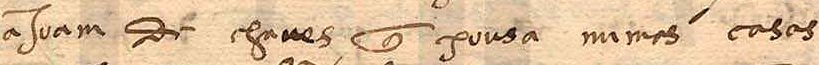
a Joam de chaues q̄ pousa numas casas
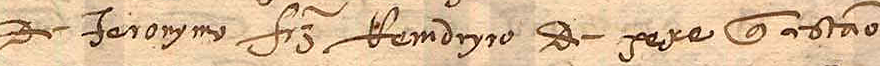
de Jeronymo frz̄ Remdeyro de pexe q̄ estão
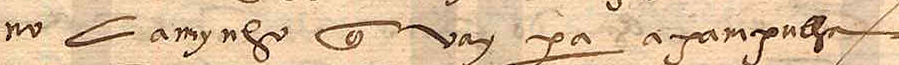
no Camynho q̄ vay ꝑa a pampulha/
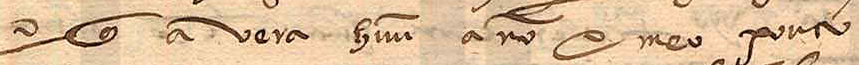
e q̄ avera hūu an̄o q meo pouco
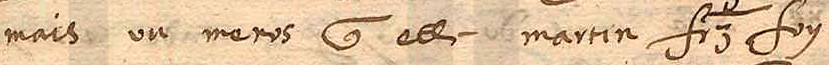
mais ou menos q̄ elle martin fr̄z foy
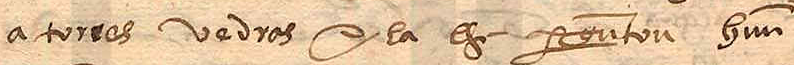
a torres vedras e la lhe ꝑgūtou hūu
